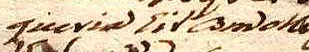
queria hir com elle
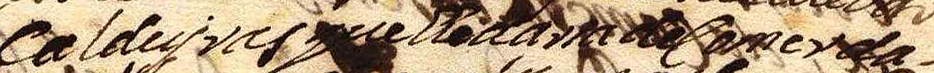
caldeyras que lhe daria de Comer da
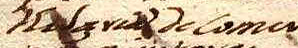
lhe daria de comer
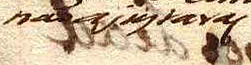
naõ ajustaraõ
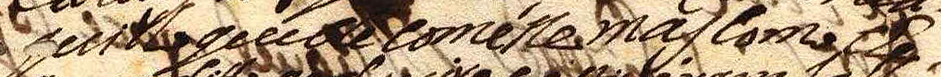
quillo que elle comesse mas como che
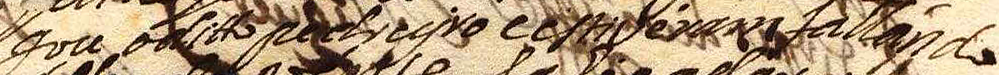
gou o ditto pedreyro e estiveram fallando
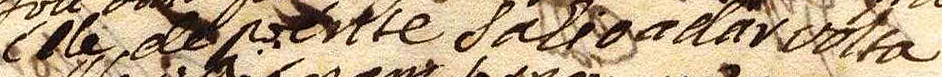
elle depoente sahio a dar volta
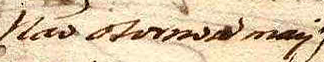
Naõ o tornou mais
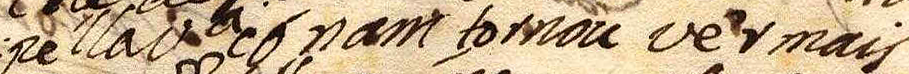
pélla v.a e o nam tornou ver mais
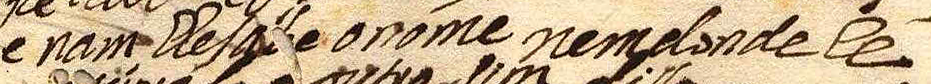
e nam lhe sabe o nome nem donde hé
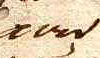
a ver
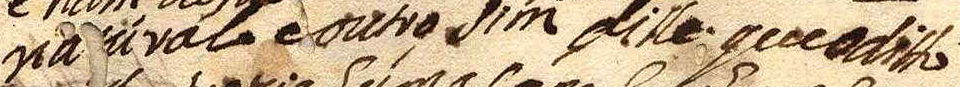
naturaL e outrosim disse que o ditto
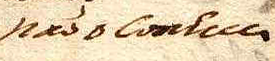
naõ o conhece
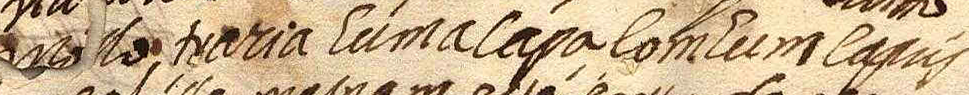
mosso trazia huma capa com hum capús
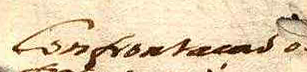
Confrontaçaõ _
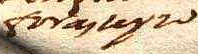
forasteyro
